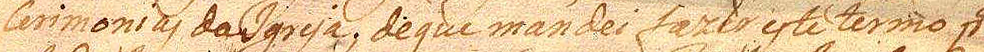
cerimonias da Igreja, de que mandei fazer este termo p.a
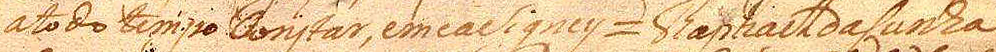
a todo tempo Constar, e me asigney= RaphaeL da Cunha
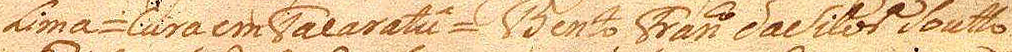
Lima= Cura em Tacaratú= Bento Franco da Silvra Soutto
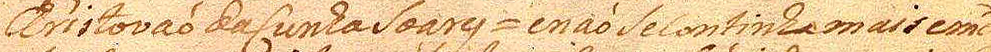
Christovaõ da Cunha Soares= e naõ se Continha mais em d.o
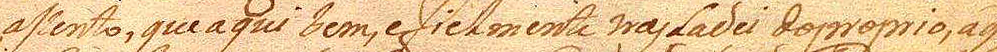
assento, que aqui bem, e fielmente trasLadei do proprio, a q̄
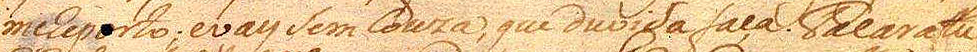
me Reporto; e vay sem Couza, que duvida faça Tacaratu
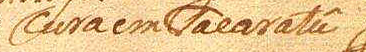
Cura em Tacaratú
